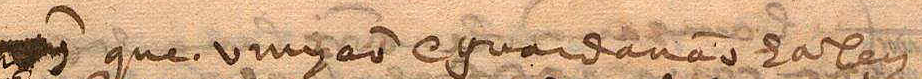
sy que. viuyaõ e guardauão ha ley
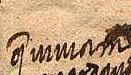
q̄ uiuam
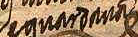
e guardauā
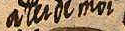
a lei de moi
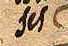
ses
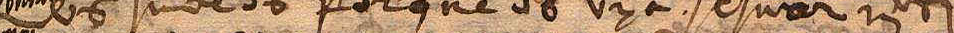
dos Judeos porque os vya JeJuar mtos
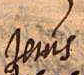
Jeiūs
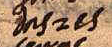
das 2 e 5
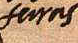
feiras
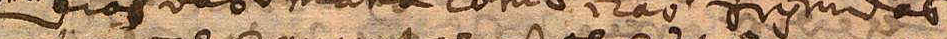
dias da somana como eraõ segundas
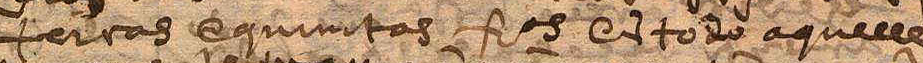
feiras e quimtas fras e ē todo aquelle
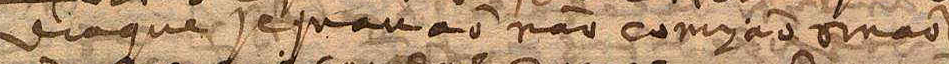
dia que JeJuauaõ naõ comyaõ senaõ
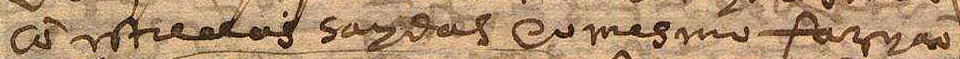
cō estrellas saydas e o mesmo fazyaõ
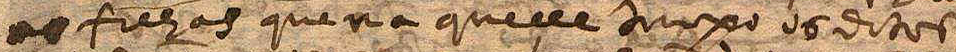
as filhas que naquelle tempo os ditos
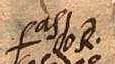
fas do R.
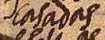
casadas
